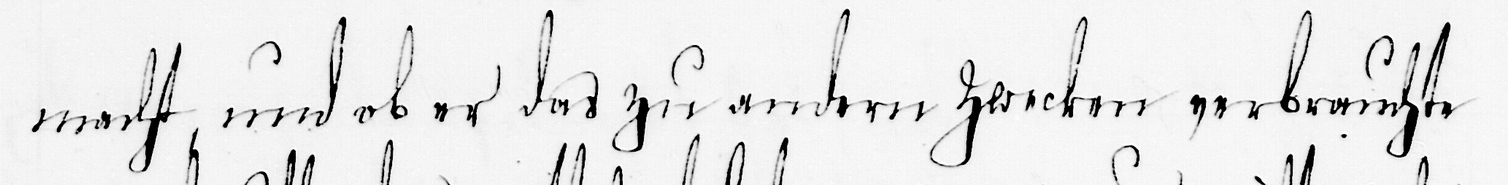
macht und ob er das zu andern Zwecken verbrauchte
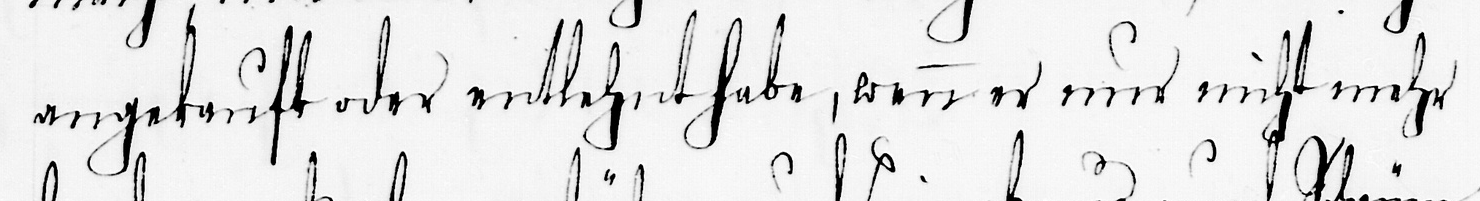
angekauft oder entlehnt habe, wenn er nur nicht mehr
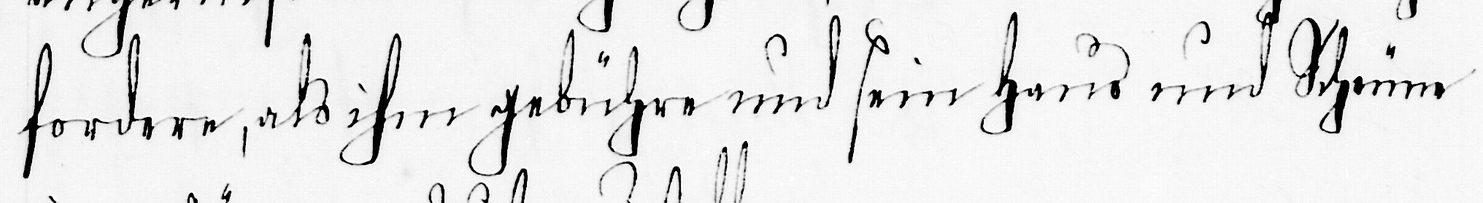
fordere, als ihm gebühre und sein Haus und Scheune
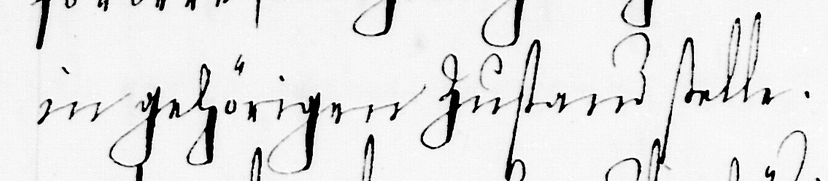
in gehörigen Zustand stelle.
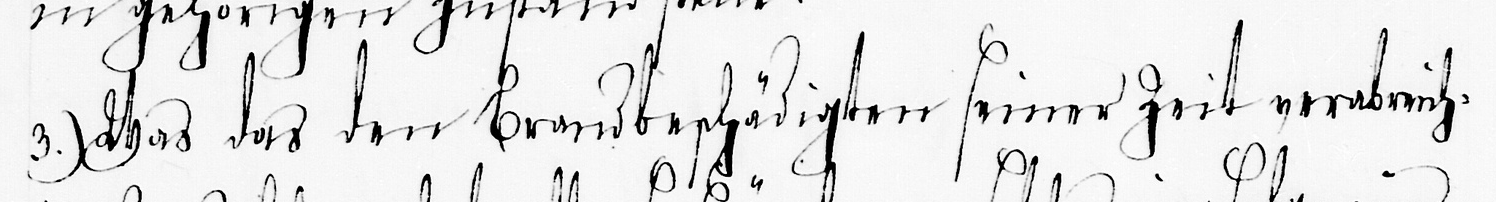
3.) Was das den Brandbeschädigten seiner Zeit verabreic¬
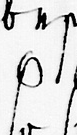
v.
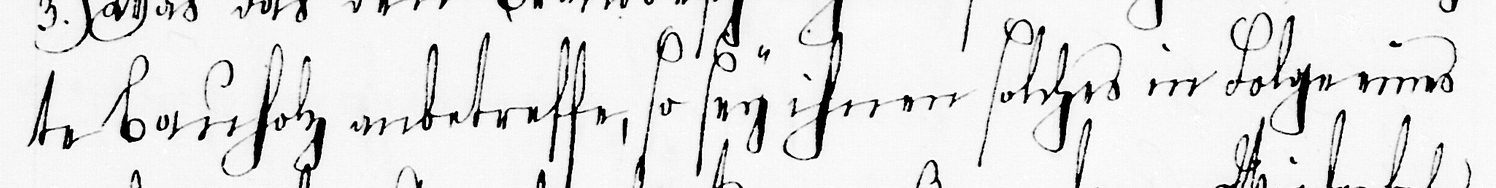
hte Bauholz anbetreffe, so sey ihnen solches in Folge eines
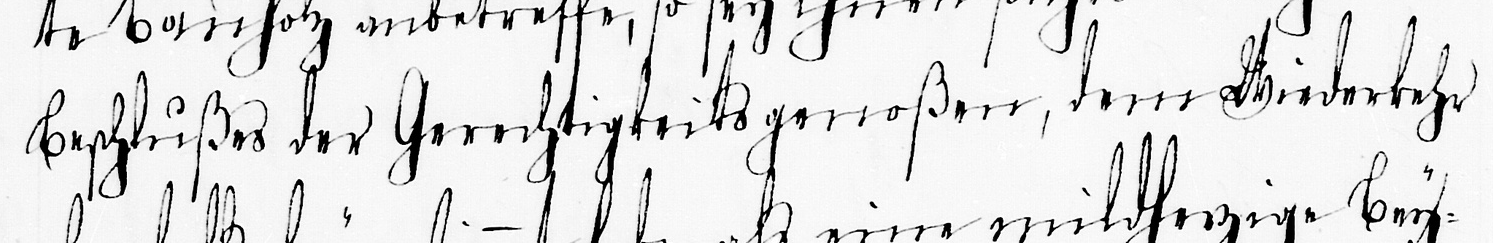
Beschlußes der Gerechtigkeitsgenoßen, dem Wiederkehr
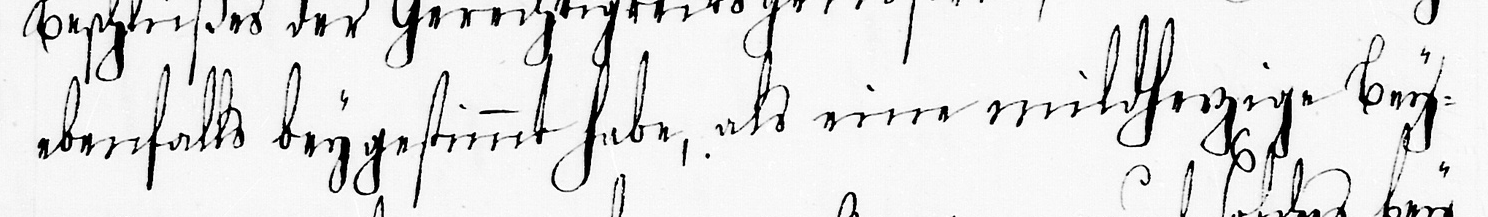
ebenfalls beygestimmt habe, als eine mildherzige Bey¬
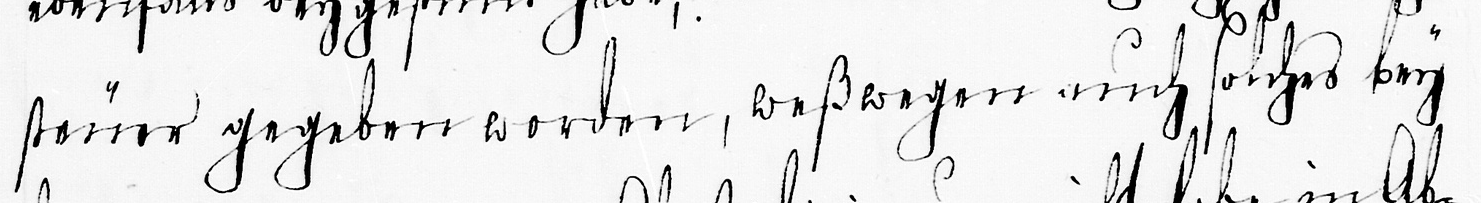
steuer gegeben worden, weßwegen auch solches bey
